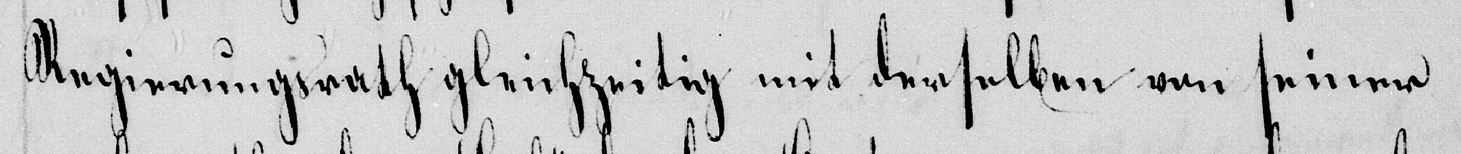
Regierungsrath gleichzeitig mit derselben von seiner
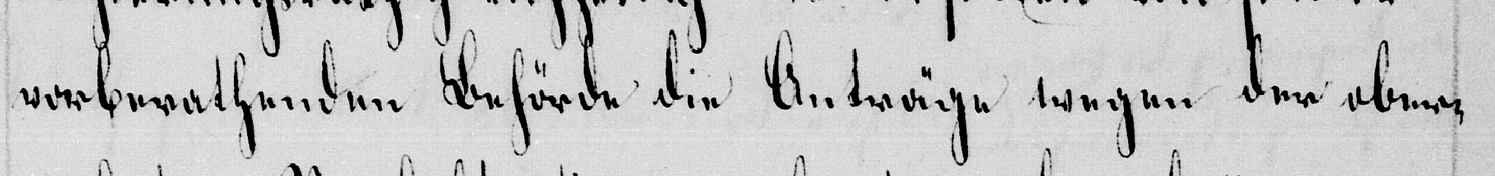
vorberathenden Behörde die Anträge wegen der ober¬
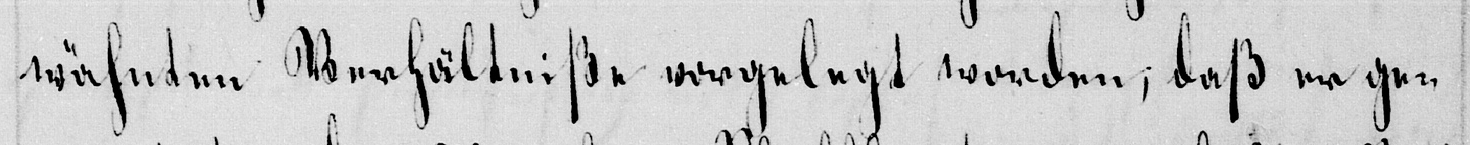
wähnten Verhältniße vorgelegt werden, daß er gen¬
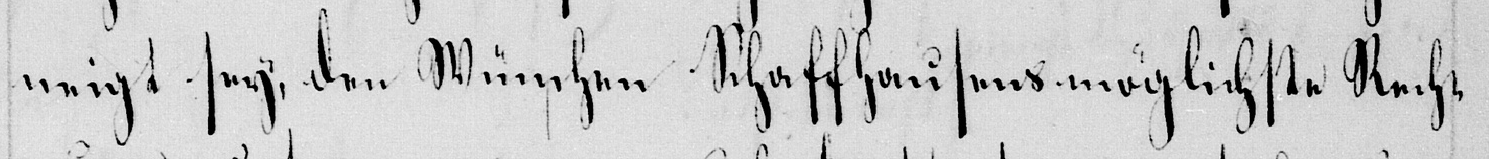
eigt sey, den Wünschen Schaffhausens möglichste Rech¬
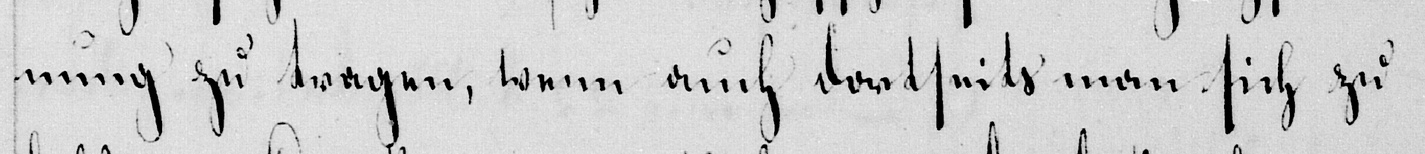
nung zu tragen, wenn auch dortseits man sich zu
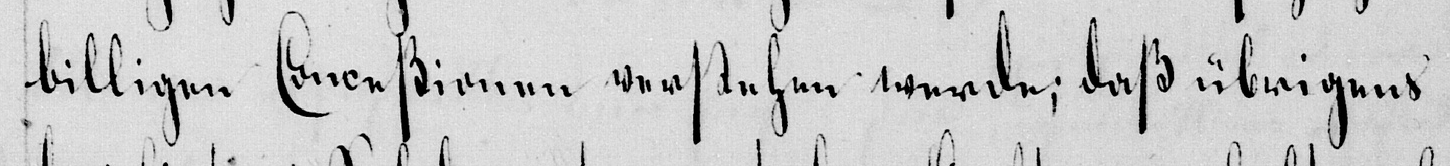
billigen Conceßionen verstehen werde; daß übrigens
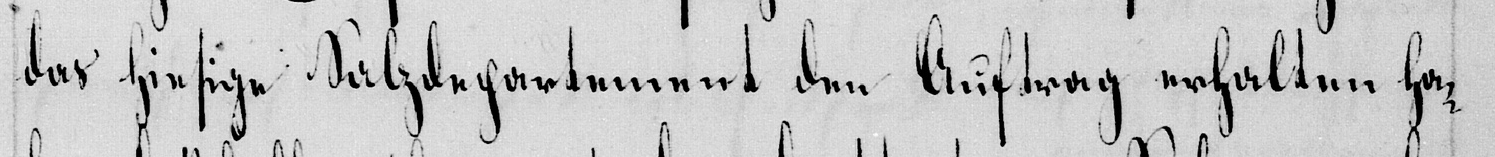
das hiesige Salzdepartement den Auftrag erhalten ha¬
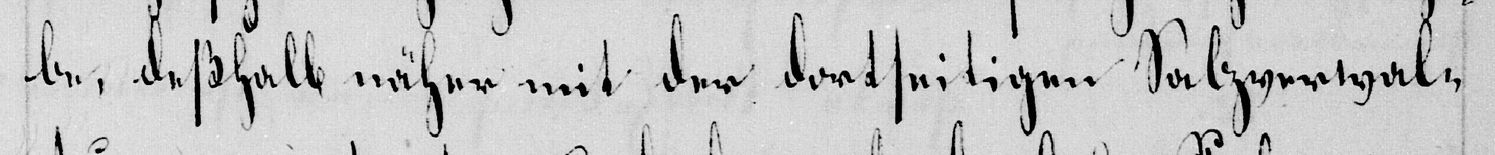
be, deßhalb näher mit der dortseitigen Salzverwal¬
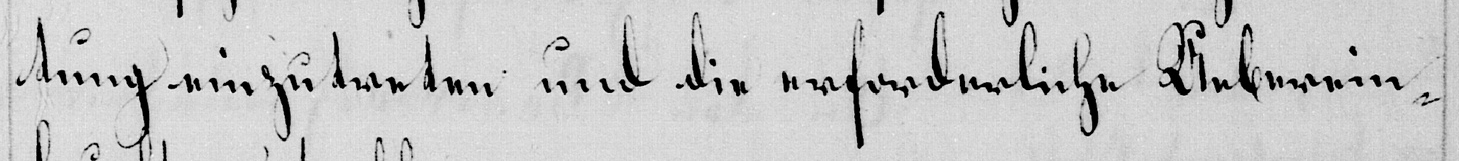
tung einzutreten und die erforderliche Ueberein¬
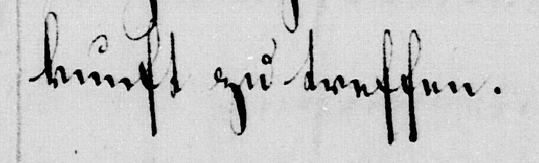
kunft zu treffen.
